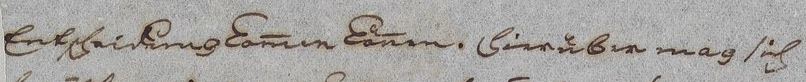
Entscheidung kommen können. Hierüber mag sich
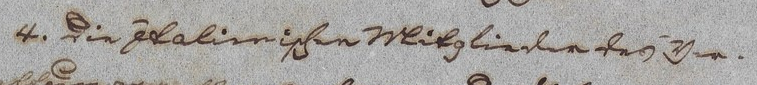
4. Die Italienischen Mitglieder des Ver-
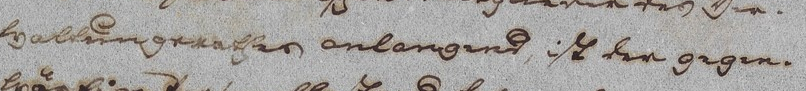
waltungsrathes anlangend, ist der gegen-
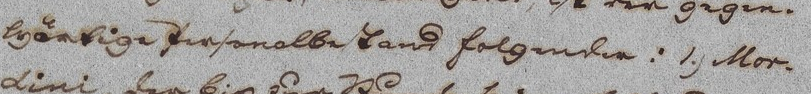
wärtige Personalbestand folgender: 1.) Mor-
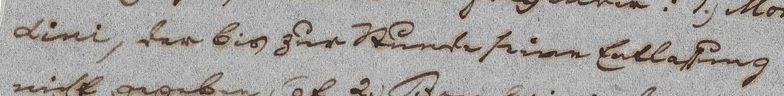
dini, der bis zur Stunde seine Entlassung
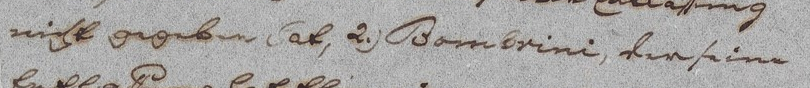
nicht gegeben hat, 2.) Bombrini, der seine
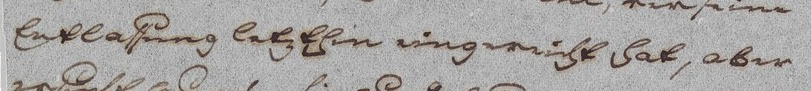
Entlassung letzthin eingereicht hat, aber
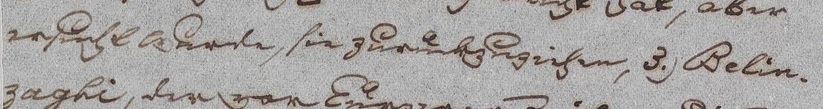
ersucht wurde, sie zurückzuziehen, 3.) Belin-
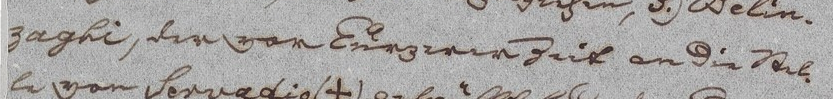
zaghi, der vor kürzerer Zeit an die Stel-
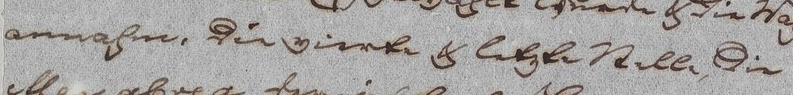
annahm. Die vierte & letzte Stelle, die
